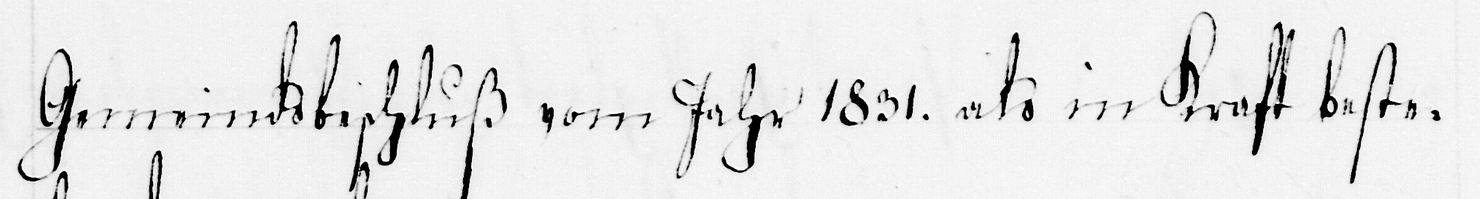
Gemeindsbeschluß vom Jahr 1831. als in Kraft beste¬
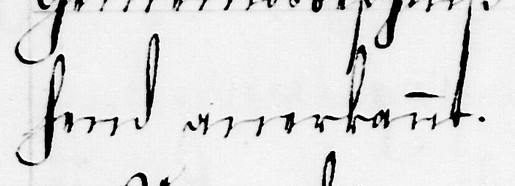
hend anerkannt.
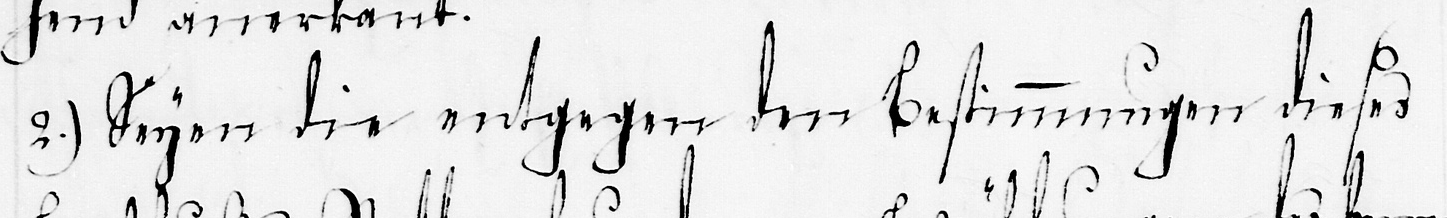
2.) Seyen die entgegen den Bestimmungen dieses
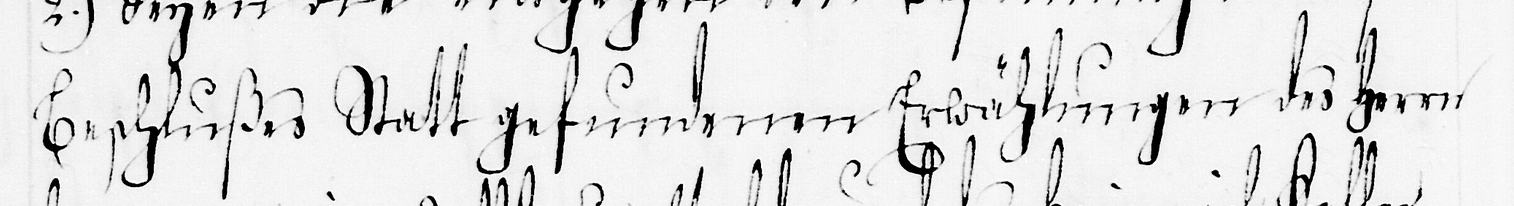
Beschlußes Statt gefundenen Erwählungen des Herrn
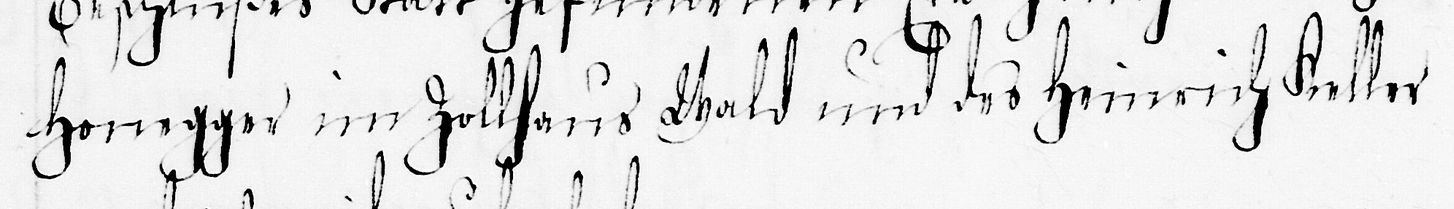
Honegger im Zollhaus Wald und des Heinrich Keller
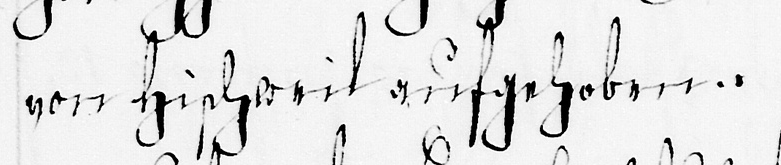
von Hischweil aufgehoben.
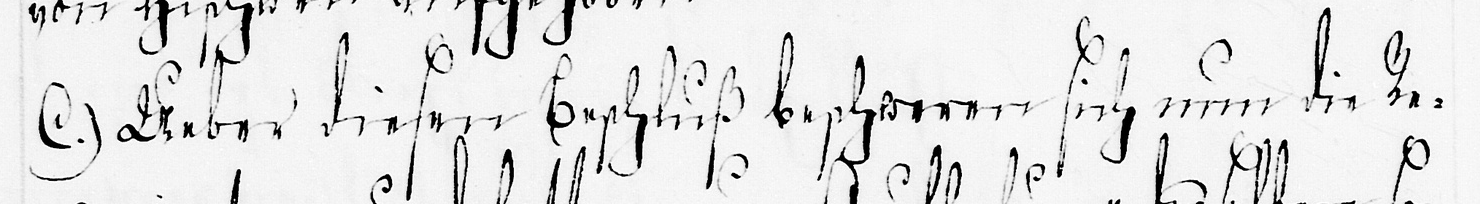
C.) Ueber diesen Beschluß beschweren sich nun die Re¬
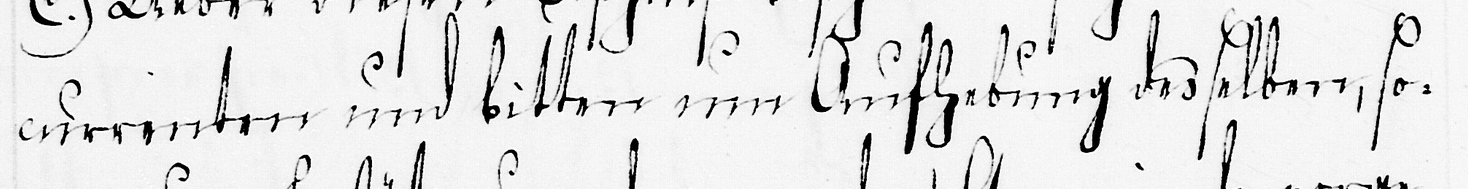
currenten und bitten um Aufhebung desselben, s¬
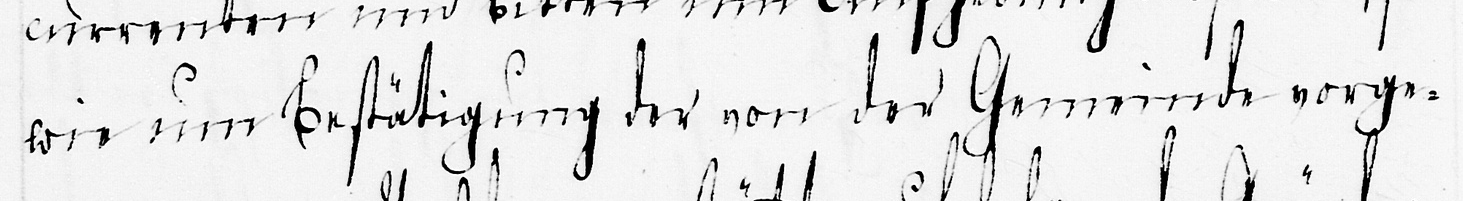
owie um Bestätigung der von der Gemeinde vorge¬
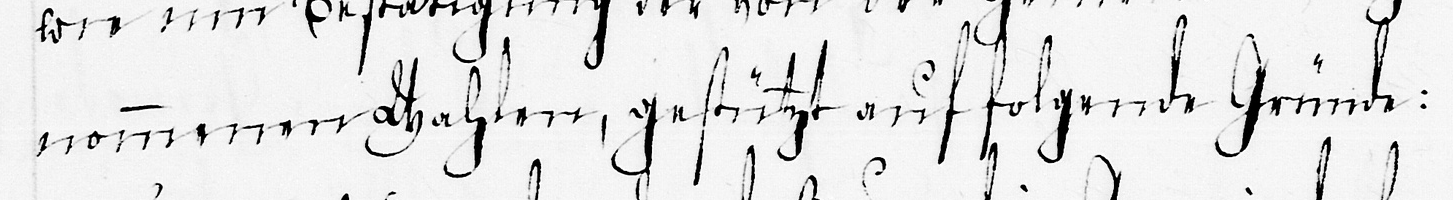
nommenen Wahlen, gestützt auf folgende Gründe:
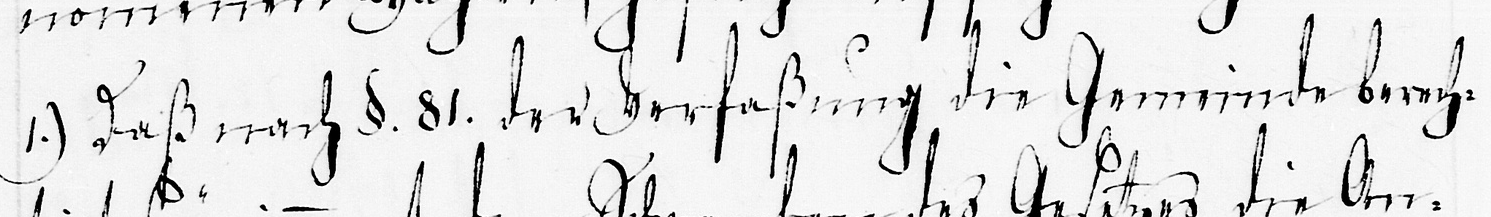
1.) Daß nach §. 81. der Verfaßung die Gemeinde berech¬
